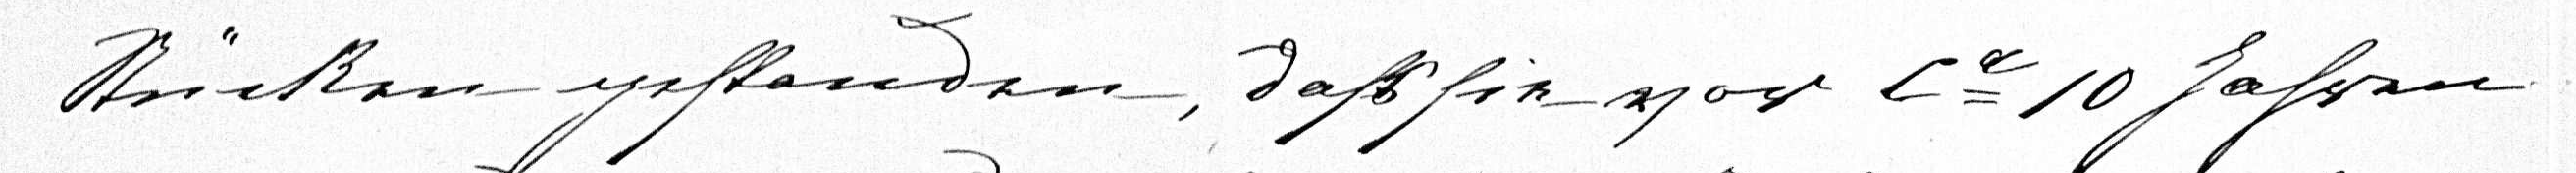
Stücken gestanden, daß sie vor Ca 10 Jahren
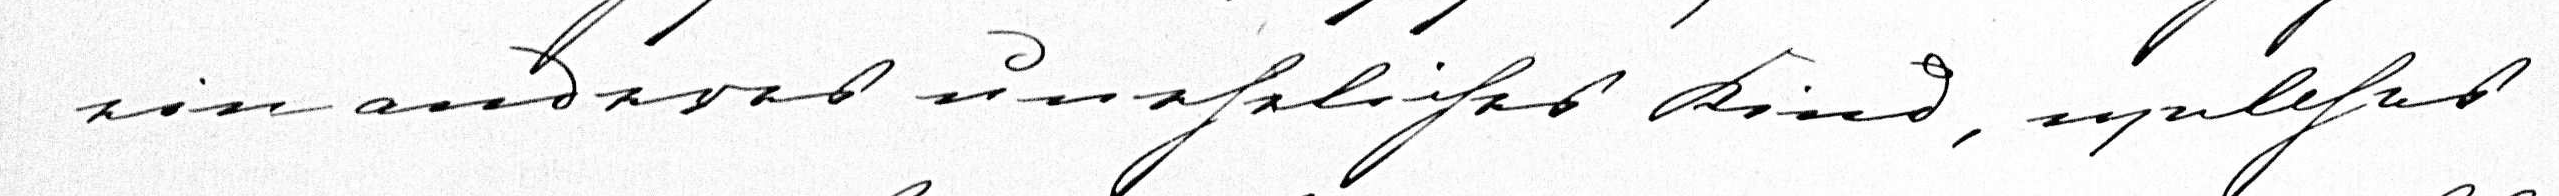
ein anderes uneheliches kind, welches
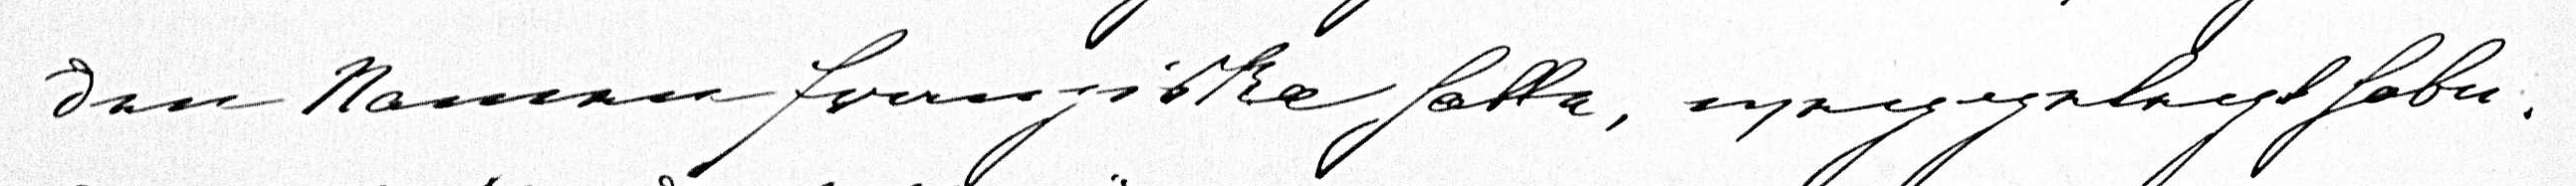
den Namen Franziska hatte, weggelegt habe.
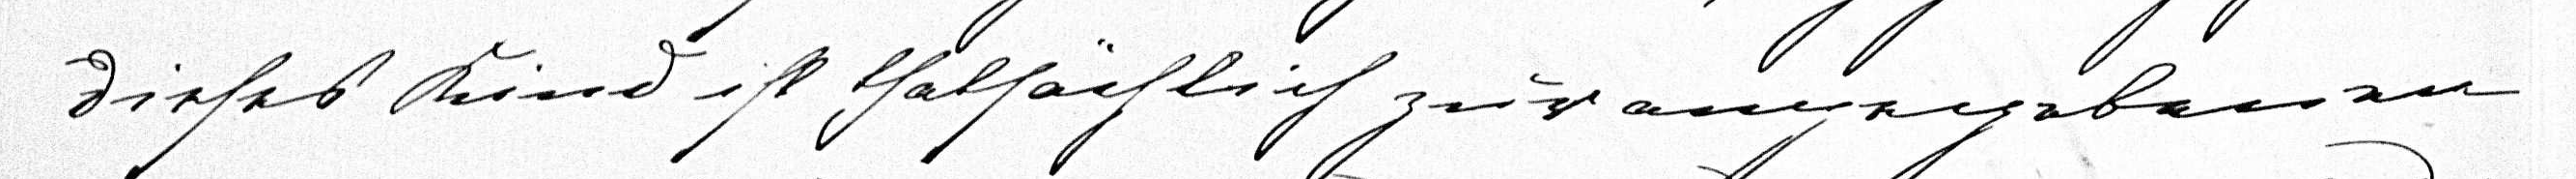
Dieses Kind ist thatsächlich zur angegebenen
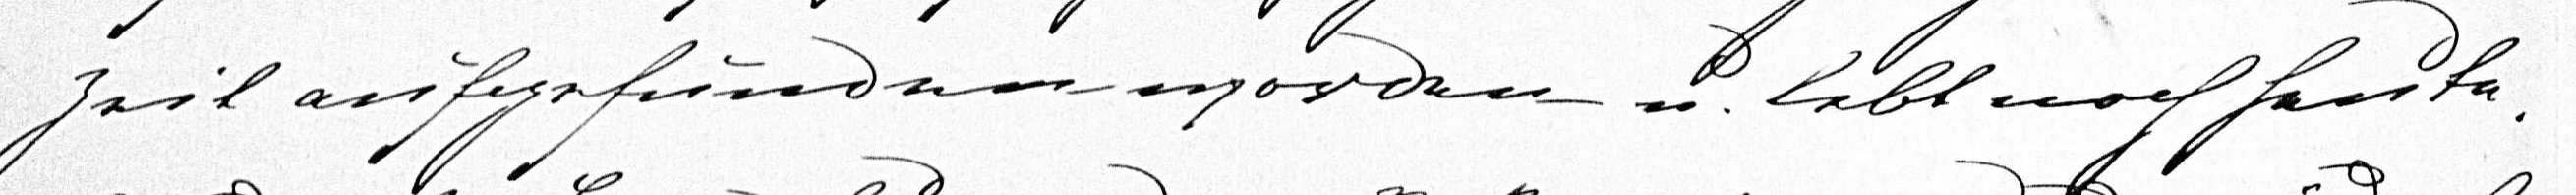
Zeit aufgefunden worden u. lebt noch heute.
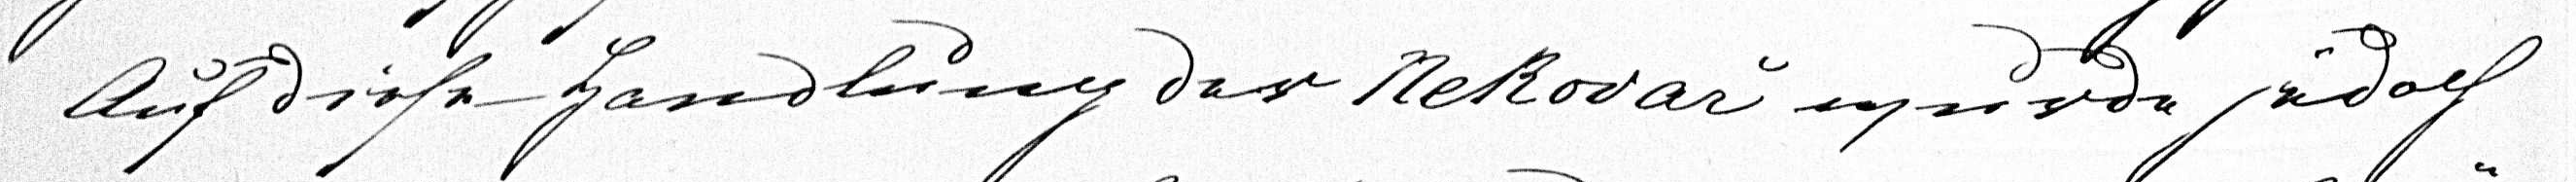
Auf diese Handlung der Nekovař wurde jedoch
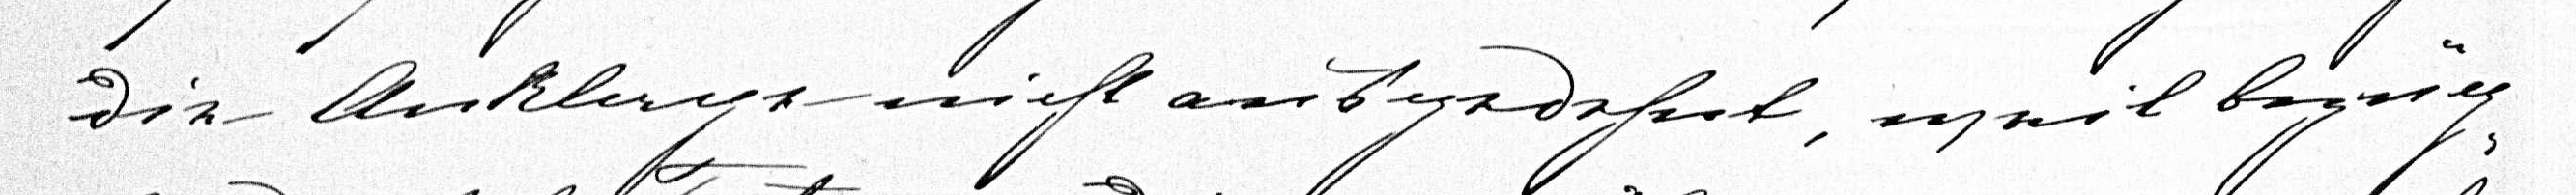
die Anklage nicht ausgedehnt, weil bezüg¬
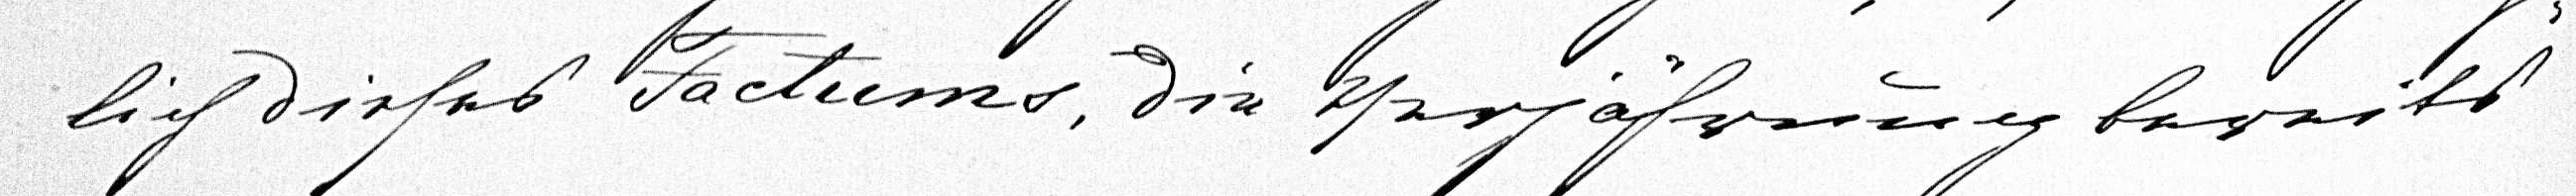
lich dieses Factumes, die Verjährung bereits
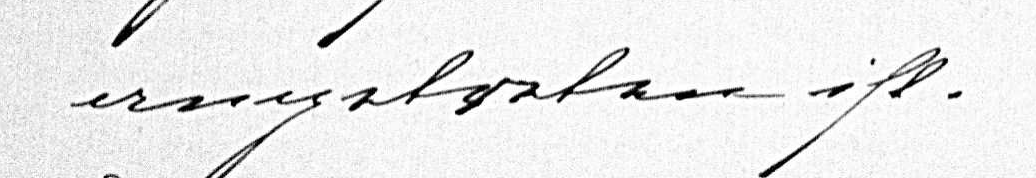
angetreten ist.
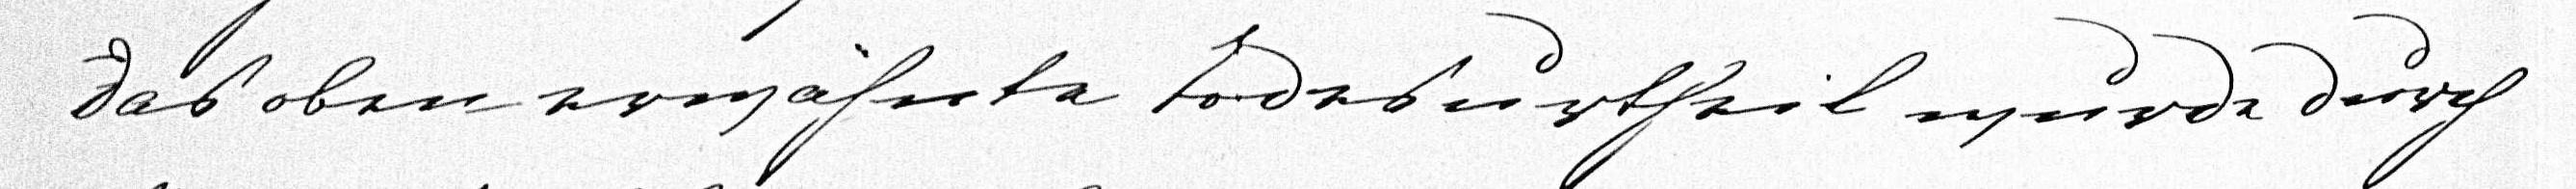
Das oben erwähnte Todesurtheil wurde durch
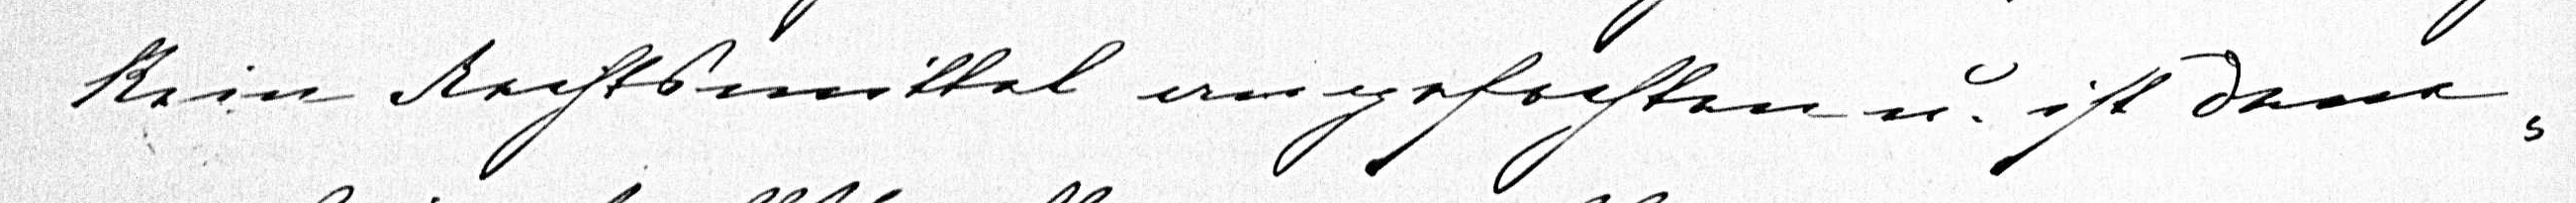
kein Rechtsmittel angefochten u. ist dem¬
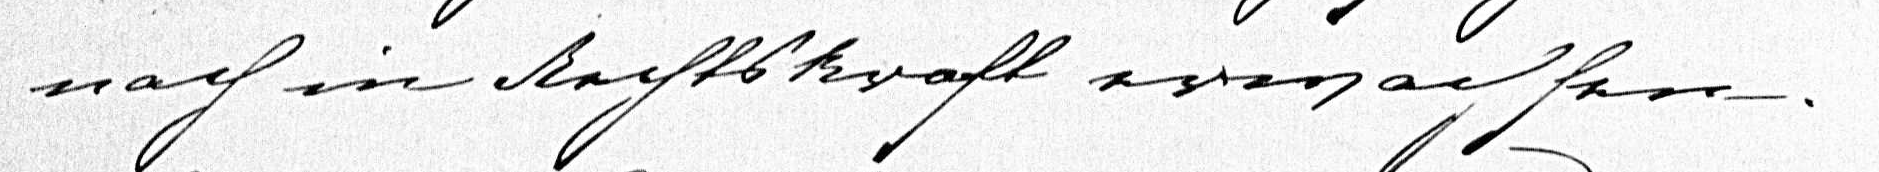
nach in Rechstkraft erwachsen.
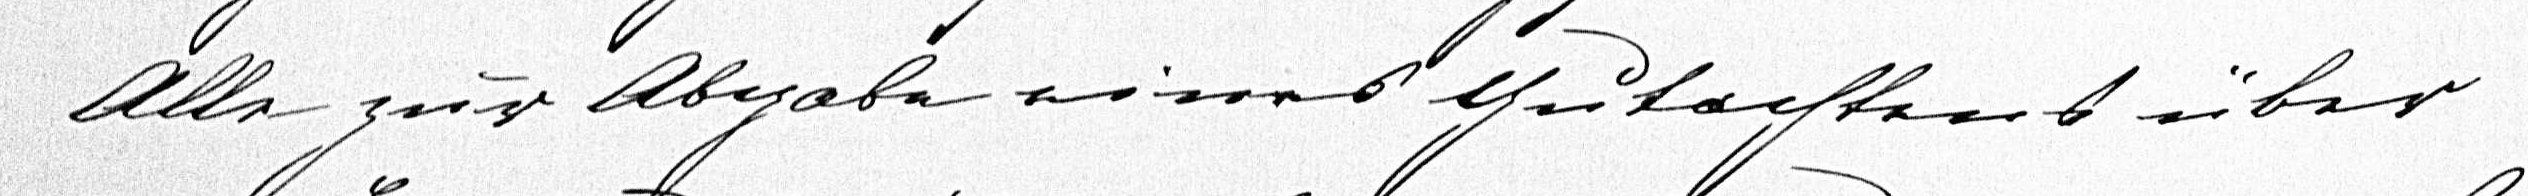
Alle zur Abgabe eines Gutachtens über
